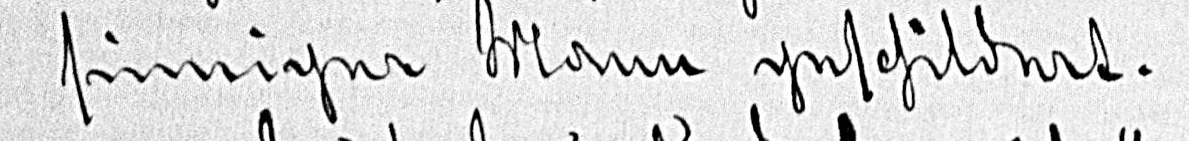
sinniger Mann geschildert.
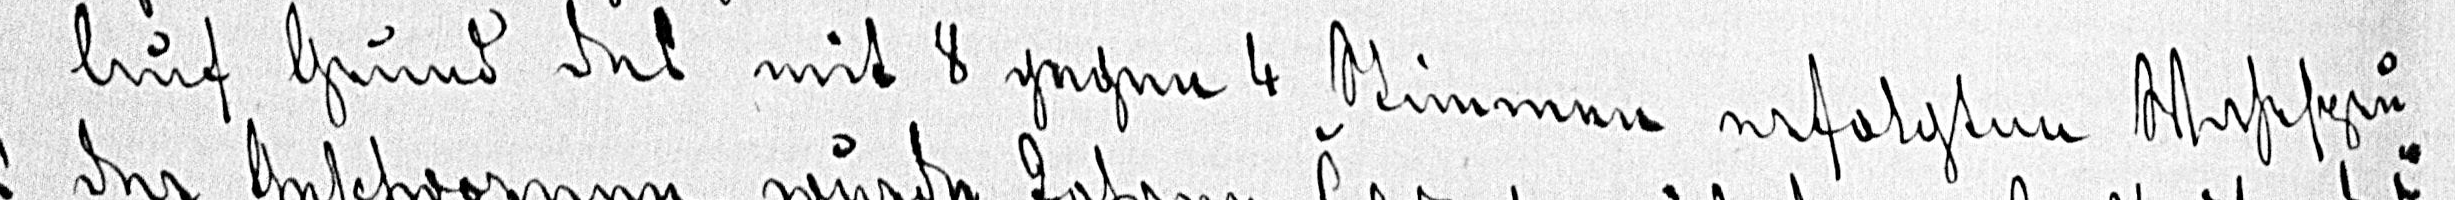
Auf Grund des mit 8 gegen 4 Stimmen erfolgten Wahrspru¬
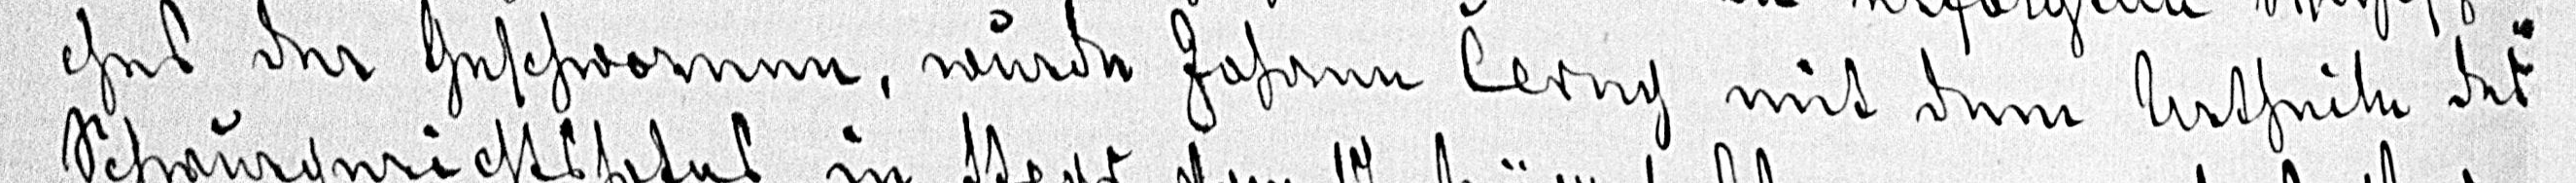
ches der Geschwornen, wurde Johann Černy mit dem Urtheile des
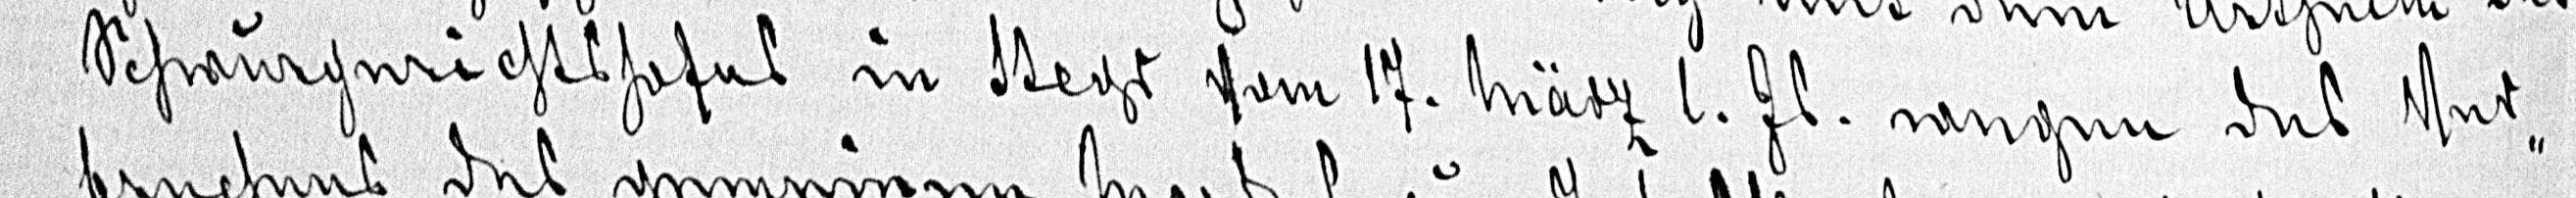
Schwurgerichtshofes in Steyr vom 17. März. 1. Js. wegen des Ver¬
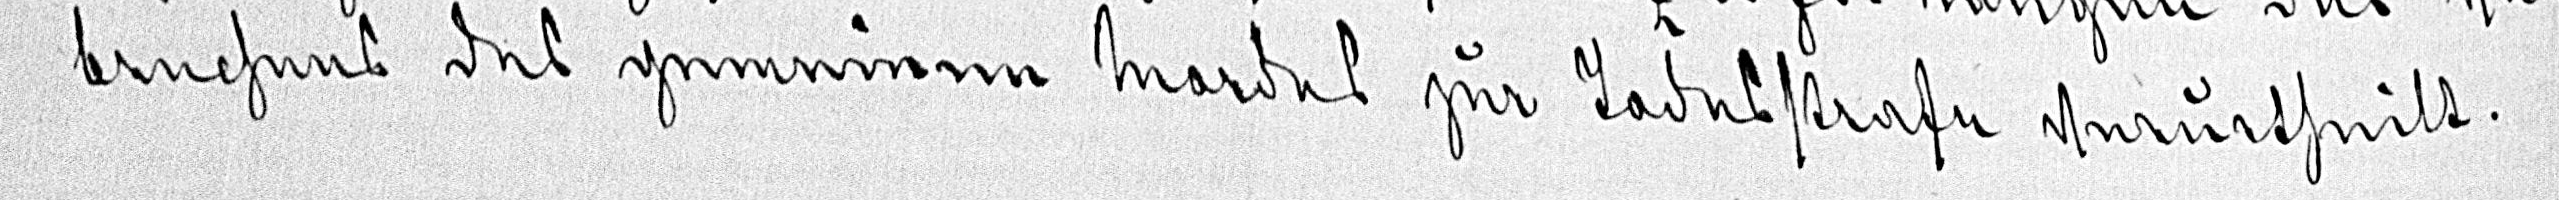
brechens des gemeinen Mordes zur Todesstrafe verurtheilt.
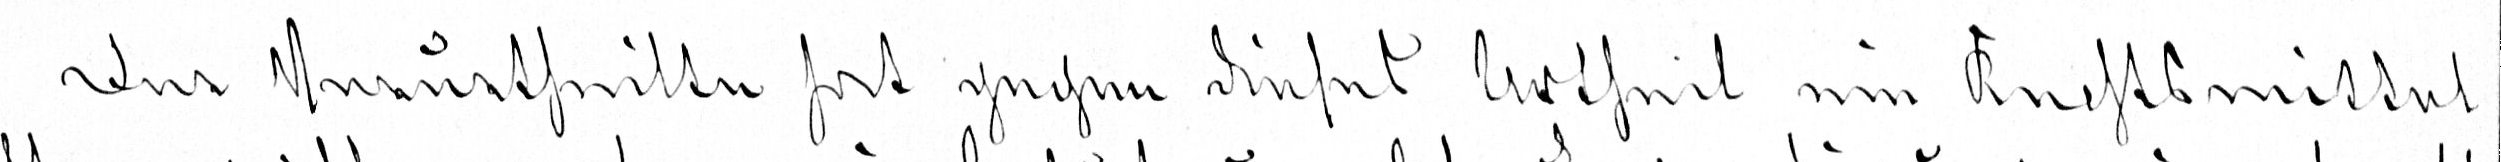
Der Verurtheilte hat gegen dieses Urtheil ein Rechtsmittel
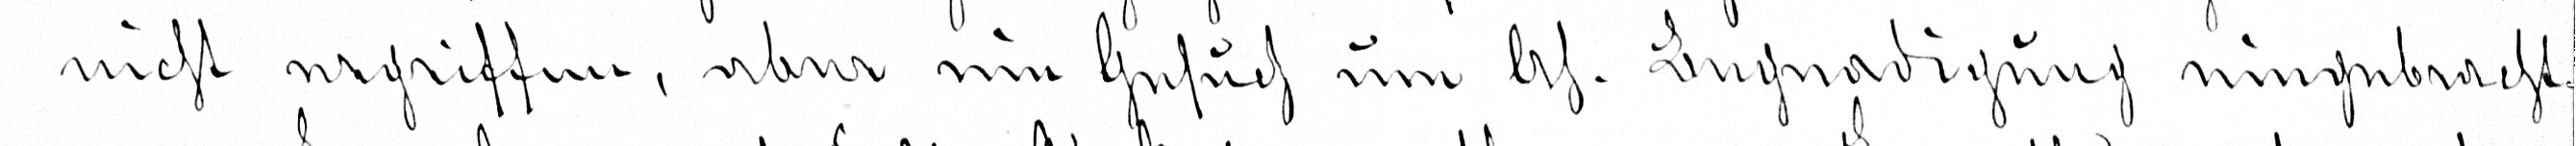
nicht ergriffen, aber ein Gesuch um Ah. Begnadigung eingebracht
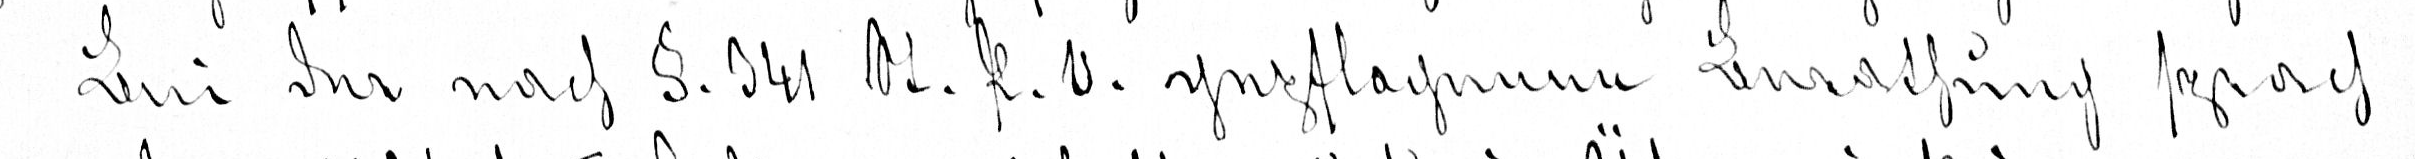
Bei der nach §. 341 xx. V. gepflogenen Berathung sprach
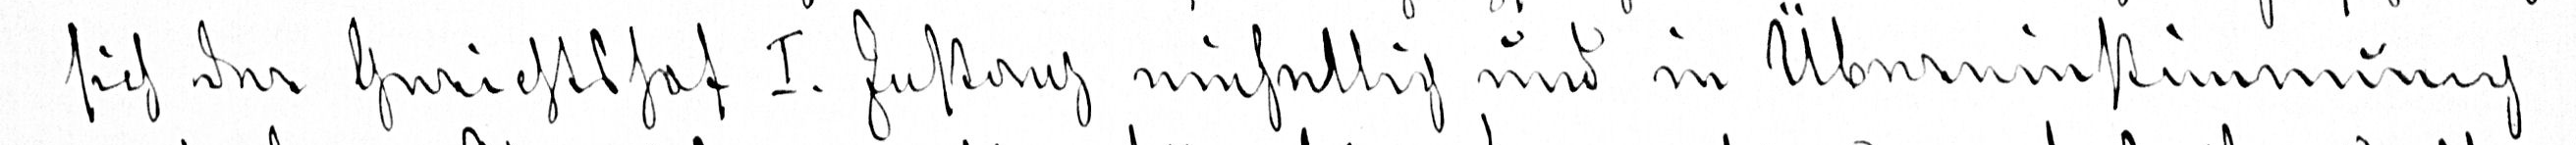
sich der Gerichtshof I. Zustanz einhellig und in Übereinstimmung
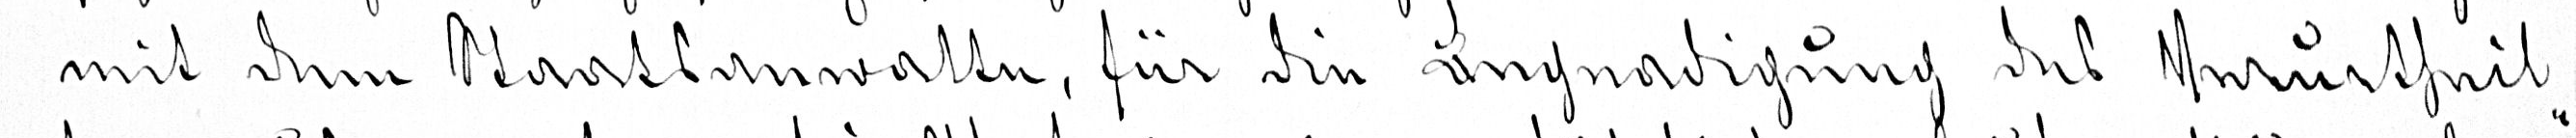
mit dem Staatsanwalte, für die Begnadigung des Verurtheil¬
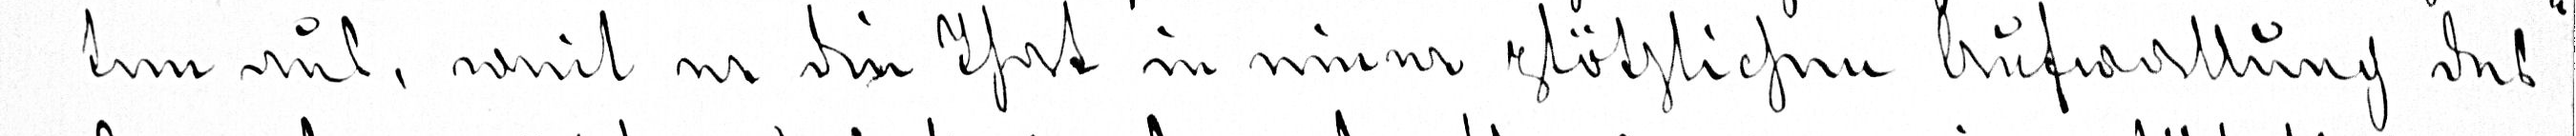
ten aus, weil er die That in einer plötzlichen Aufwallung des
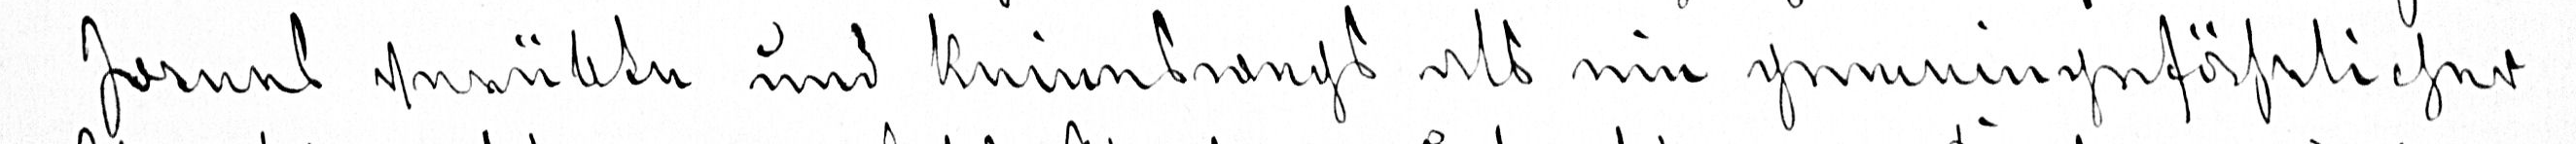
xxens verübte und keineswegs als ein gemeingefährlicher
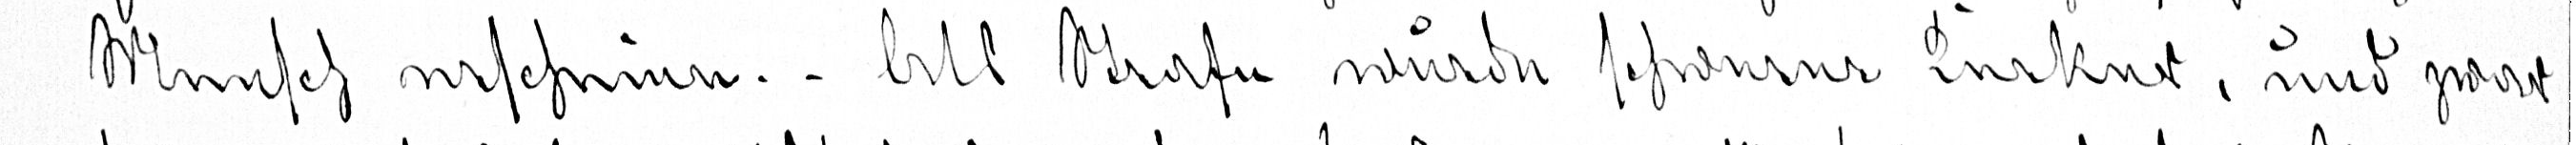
Mensch erscheine. - Als Strafe wurde schwerer Recker, und zwar
